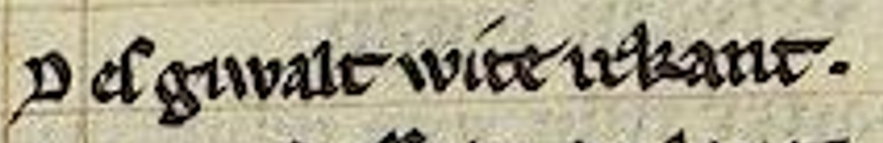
Deſ giwalt wite irkant.
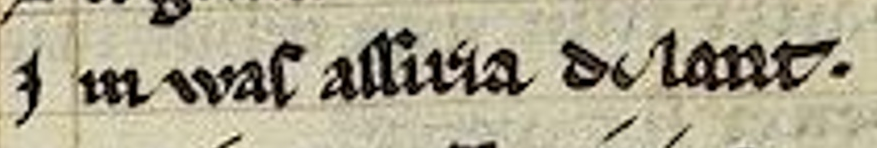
Im waſ aſſiria d(az) lant.
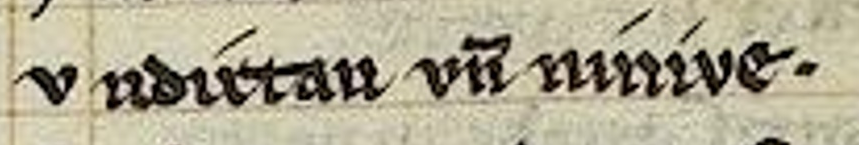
Vndirtan vn(d) ninive.
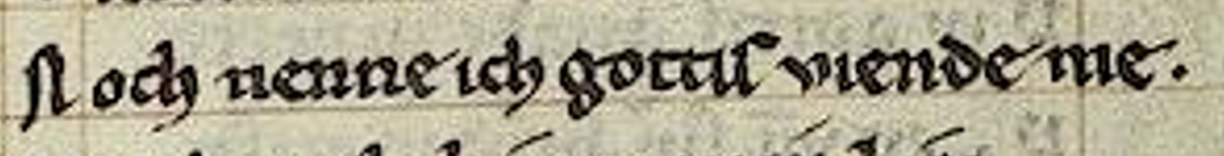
Noch nenne ich gottiſ viende me.
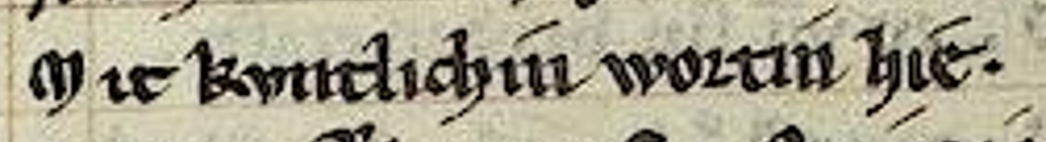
Mit kvntlichin wortin hie.
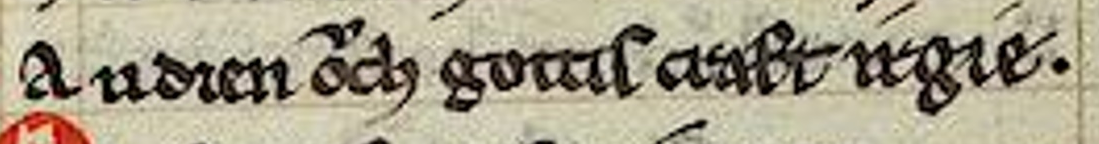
An dien o°vch gottiſ craft irgie.
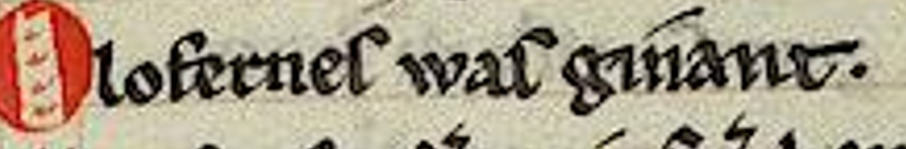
*Oloferneſ waſ ginant.
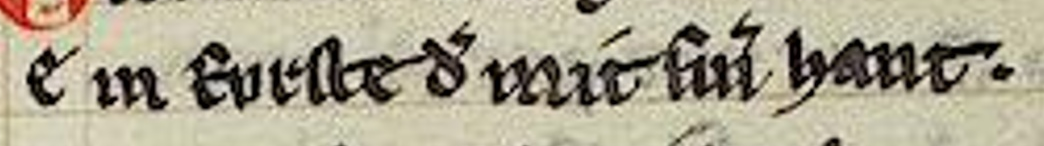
Ein fvrſte d(er) mit ſin(er) hant.
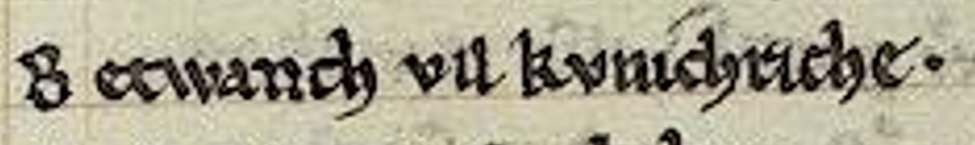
Betwanch vil kvnichriche.
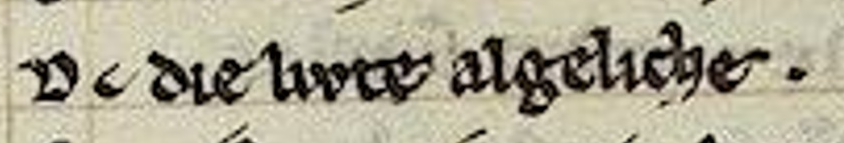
D(az) die livte algeliche.
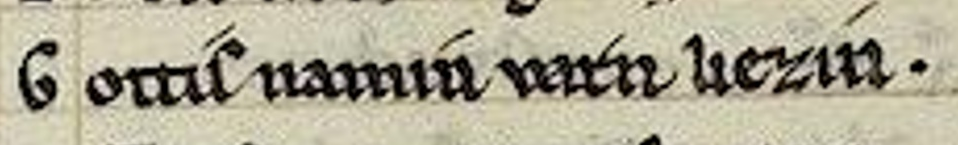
Gottiſ namin varn liezin.
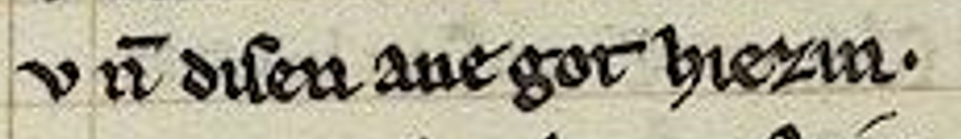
Vn(d) diven ane got hiezin.
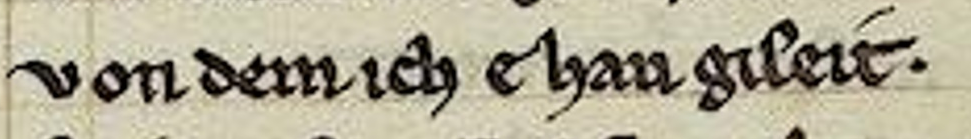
Von dem ich e han giſeit.
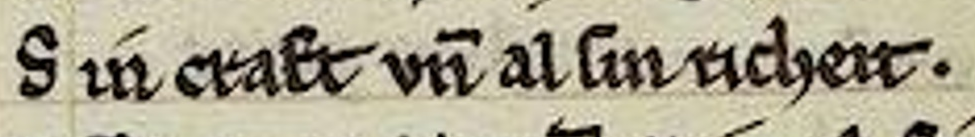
Sin craft vn(d) al ſin richeit.
